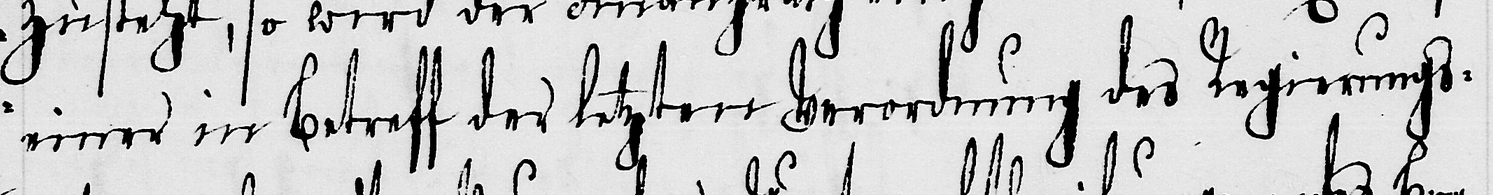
einer in Betreff der letzten Verordnung des Regierungs¬
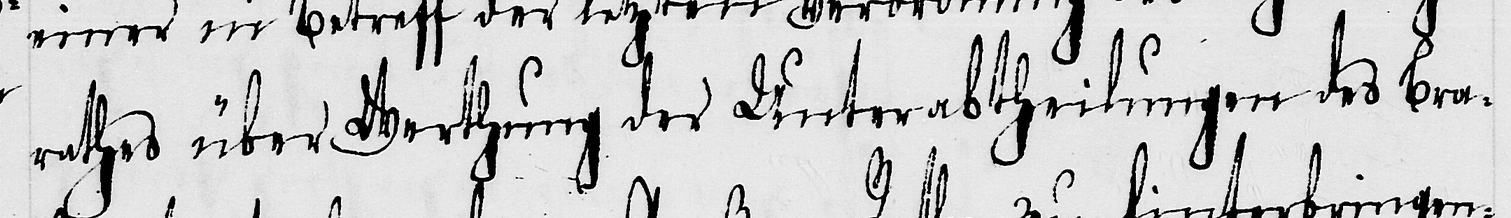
rathes über Werthung der Unterabtheilungen des Bra¬
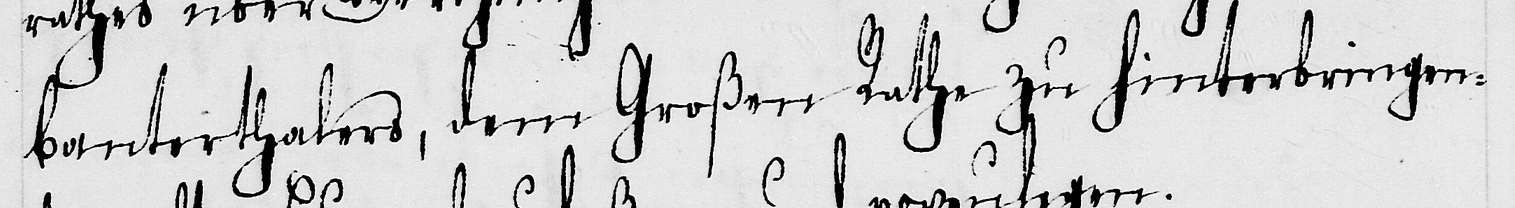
banterthalers, dem Großen Rath zu hinterbringen¬
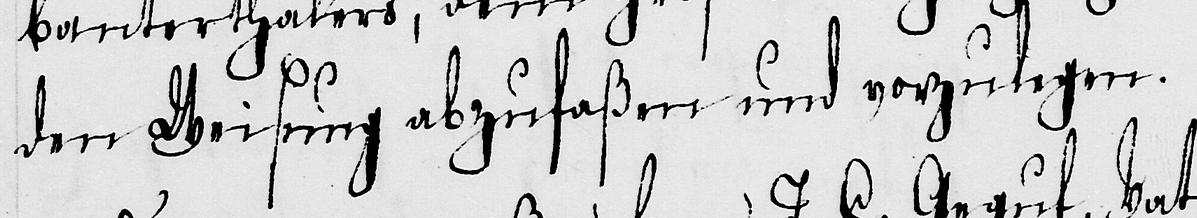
den Weisung abzufaßen und vorzulegen.
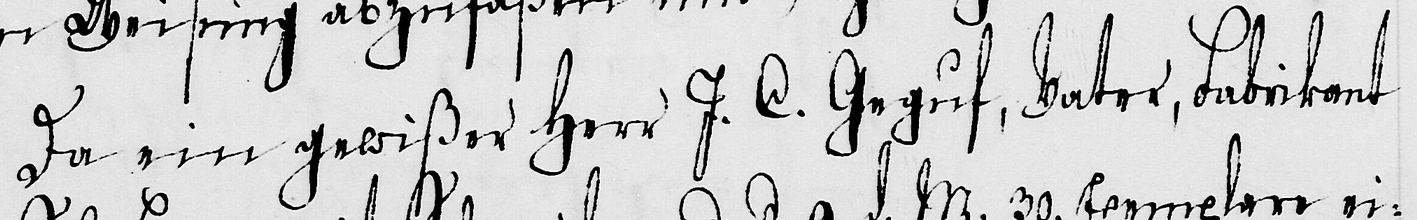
Da ein gewißer Herr J. C. Geguf, Vater, Fabrikant
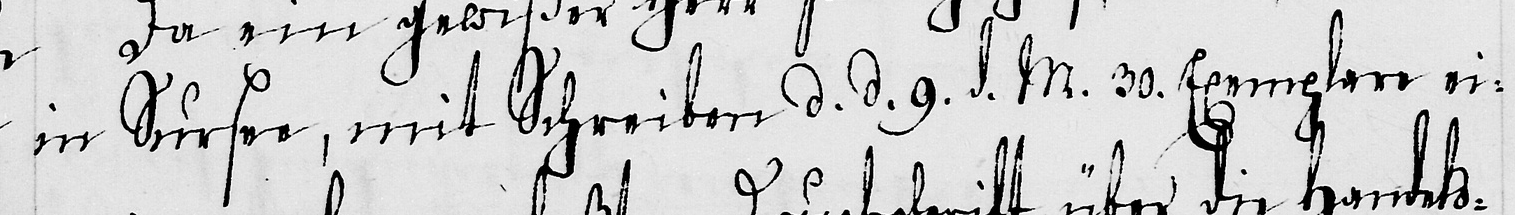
in Sursee, mit Schreiben d. d. 9. d. M. 30. Exemplare ei¬
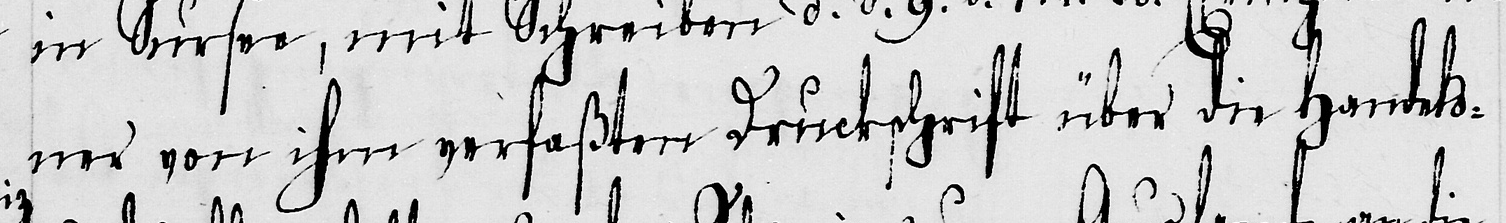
ner von ihm verfaßten Druckschrift über die Handels-
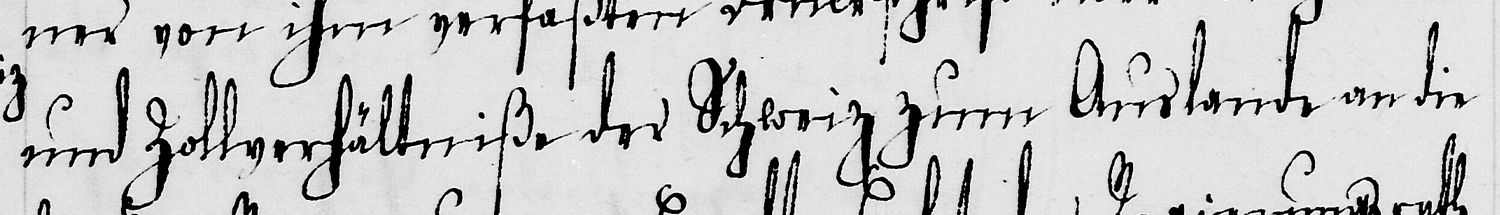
und Zollverhältniße der Schweiz zum Auslande an die
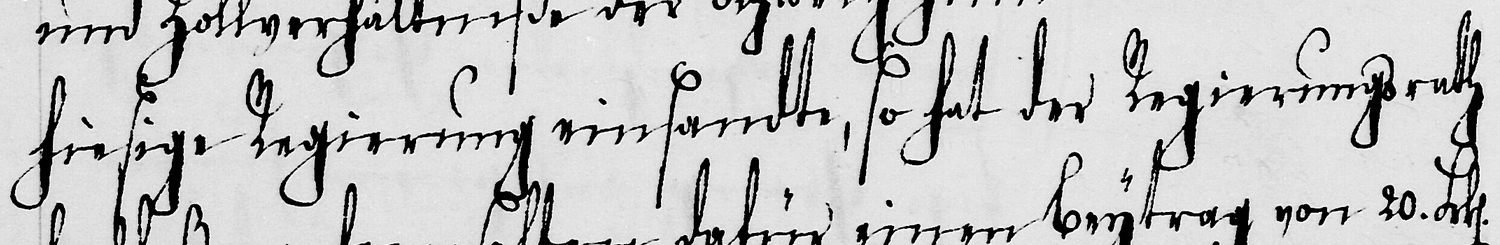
hiesige Regierung einsandte, so hat der Regierungsrath
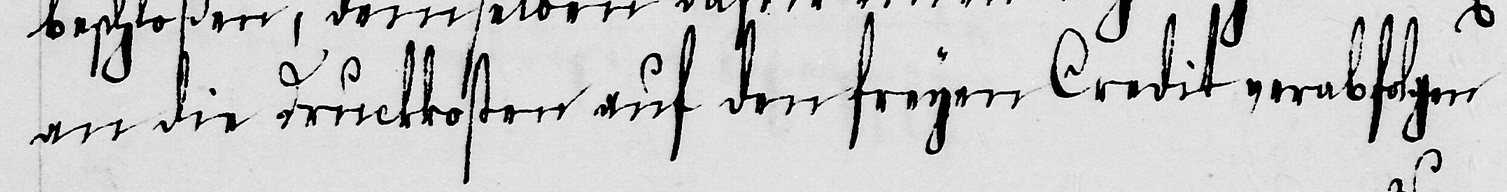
an die Druckkosten auf den freyen Credit verabfolgen
